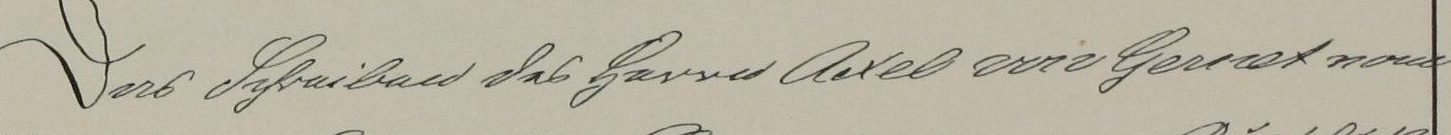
Das Schreiben des Herrn Axel von Gernet vom
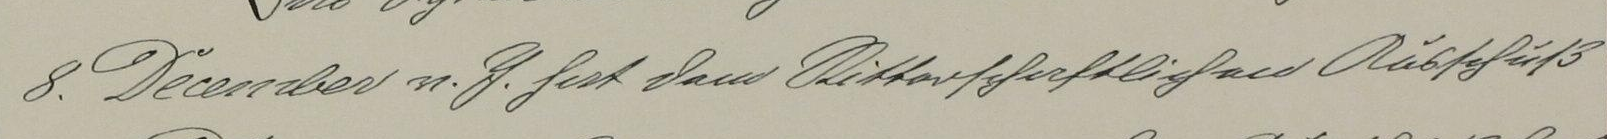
8. December v.J. hat dem Ritterschaftlichen Ausschuß
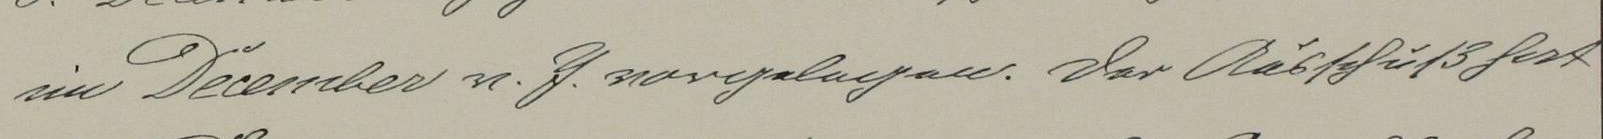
im December v.J. vorgelegen. Der Ausschuß hat
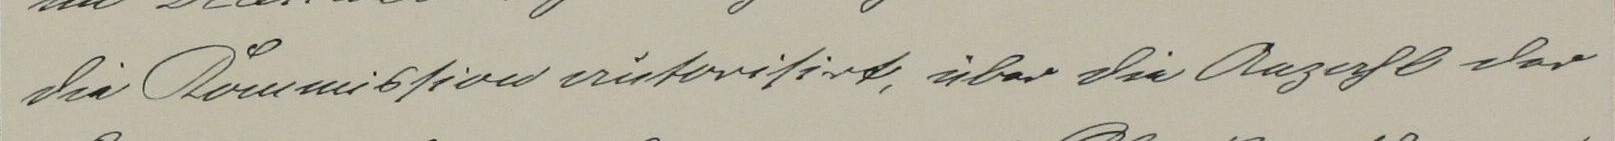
die Kommission autorisirt, über die Anzahl der
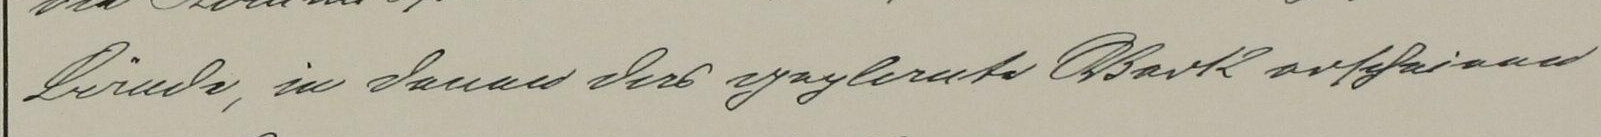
Bände, in denen das geplante Werk erscheinen
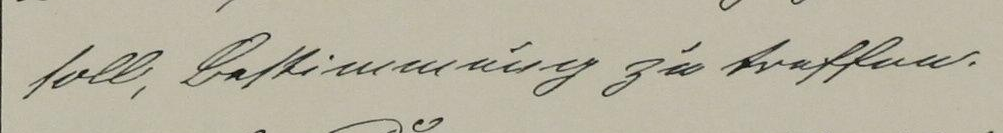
soll, Bestimmung zu treffen.
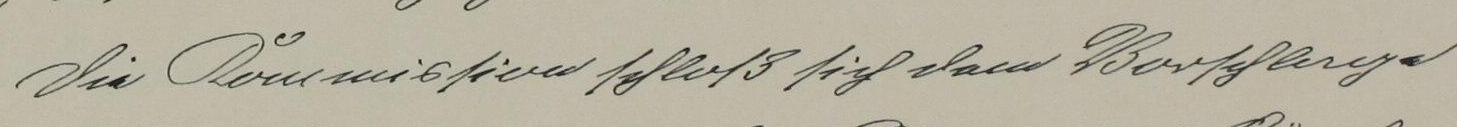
Die Kommission schloß sich dem Vorschlage
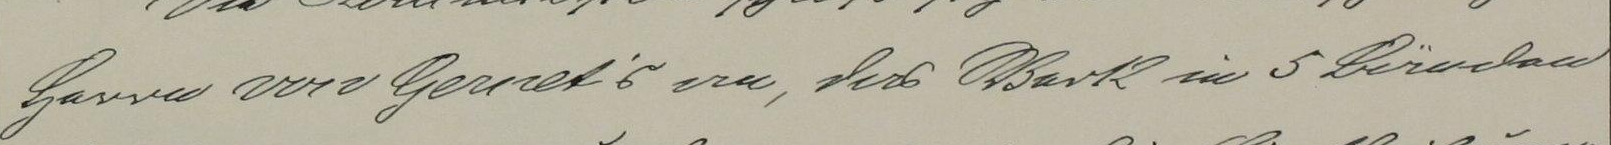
Herrn von Gernetʼs an, das Werk in 5 Bänden
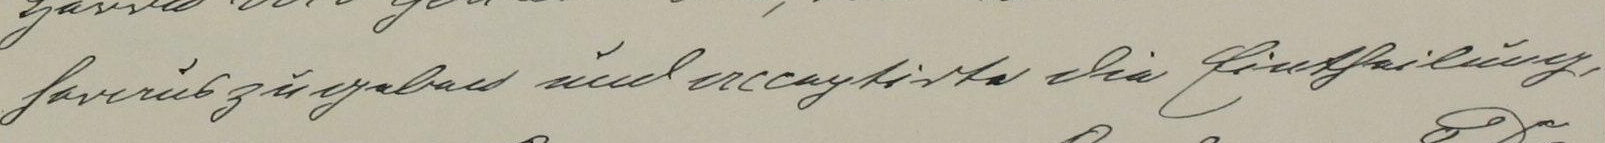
herauszugeben und acceptirte die Eintheilung,
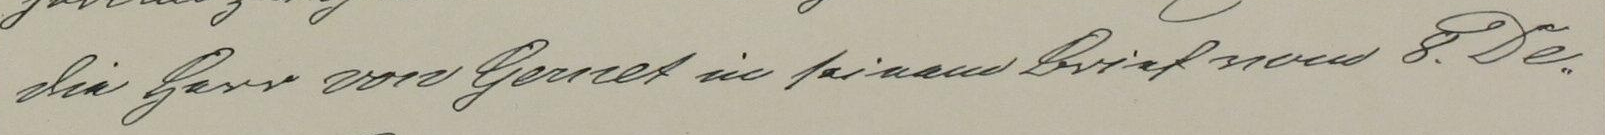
die Herr von Gernet in seinem Brief vom 8. De-
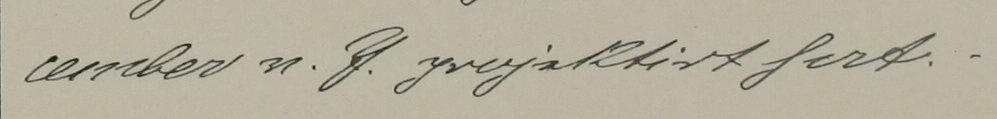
cember v.J. projektirt hat.
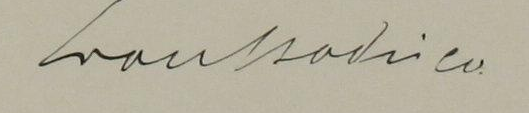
EvonBodisco
